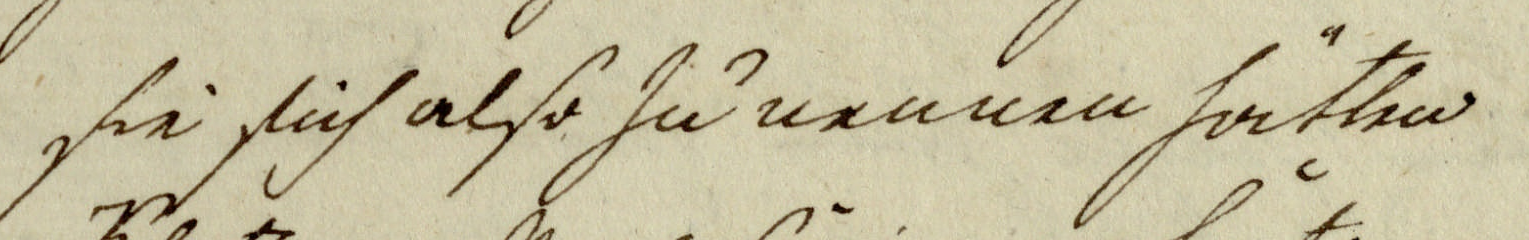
sie sich also zu nennen hätten.
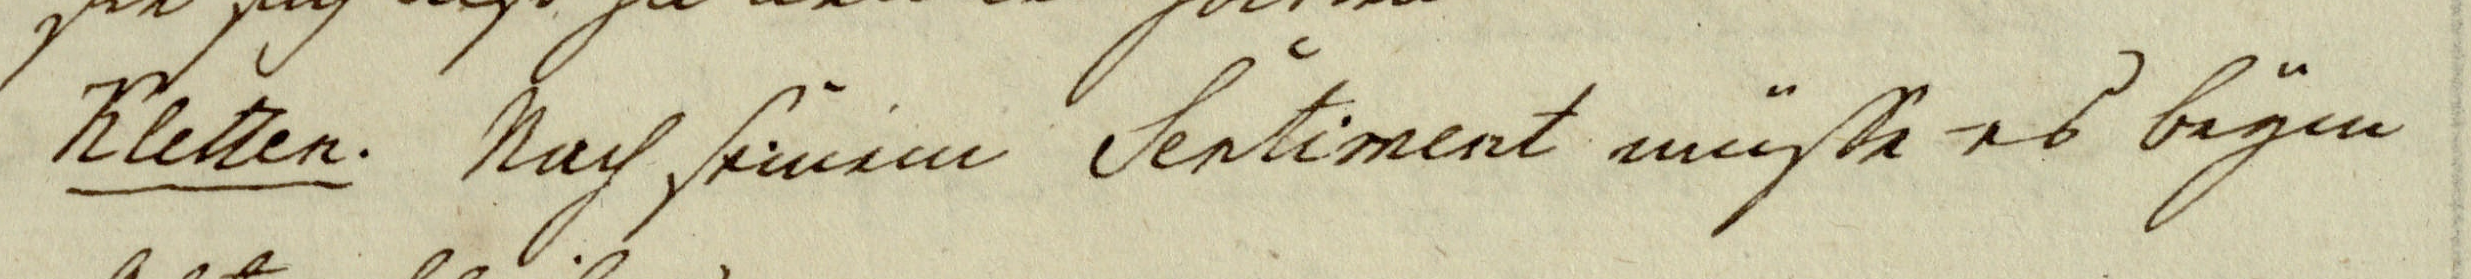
Kletten. Nach seinem Sentiment müsse es beÿm
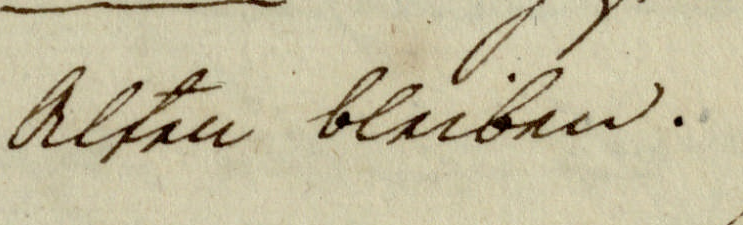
Alten bleiben.
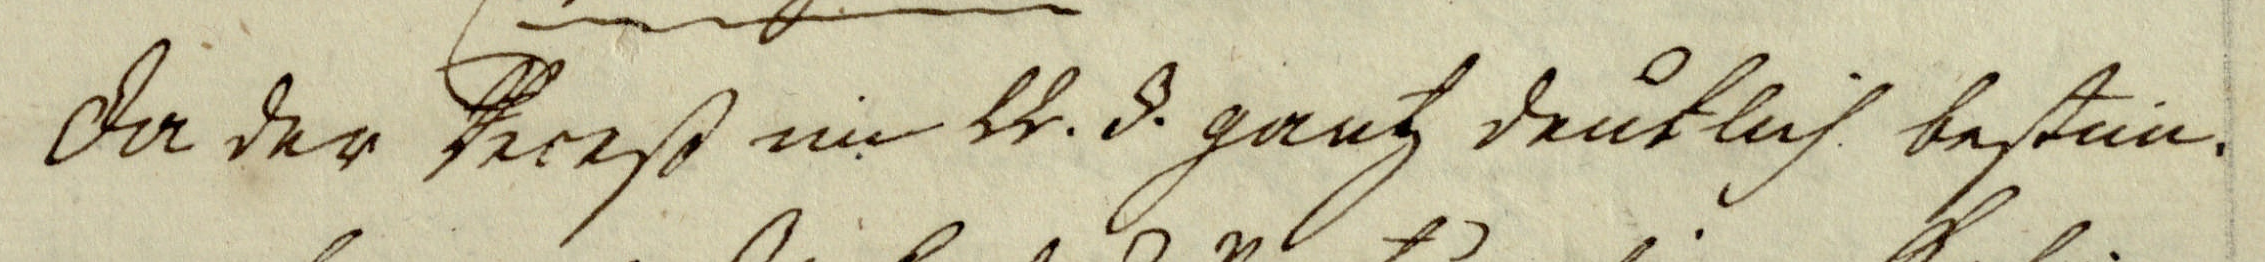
Da der Receß im 22. §. gantz deutlich bestim¬
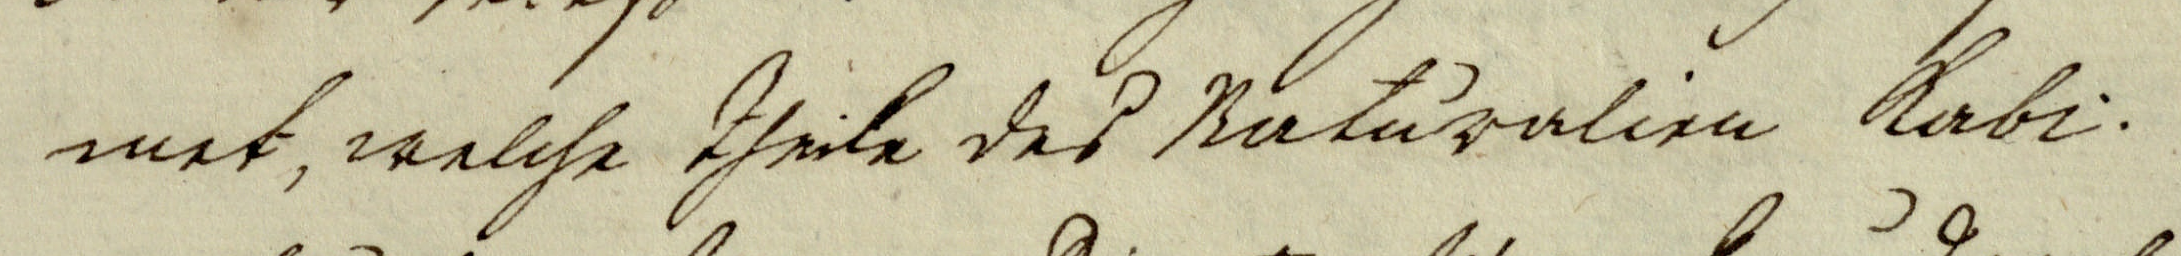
met, welche Theile des Naturalien Kabi¬
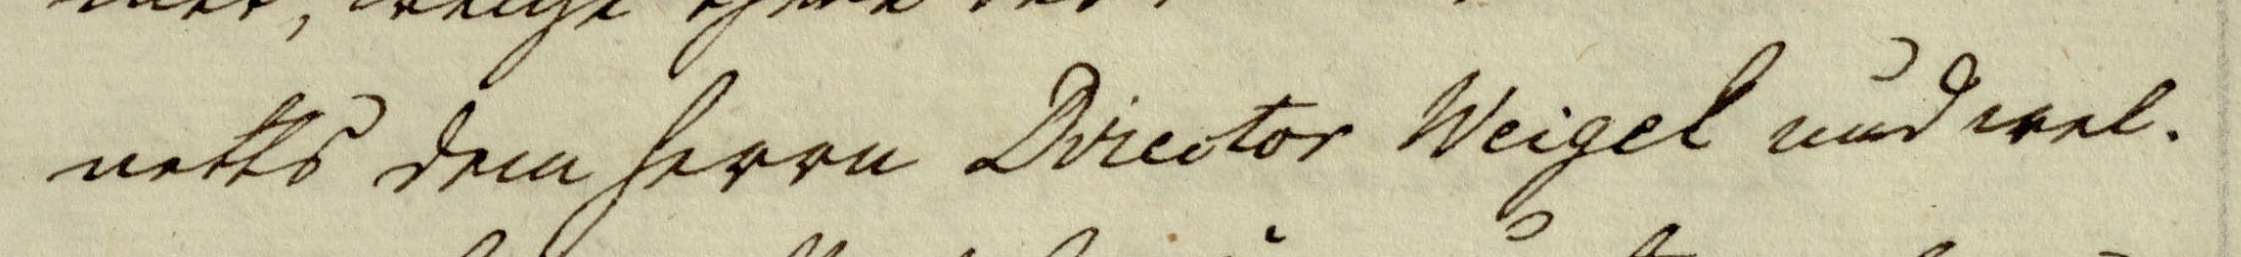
netts dem Herrn Director Weigel und wel¬
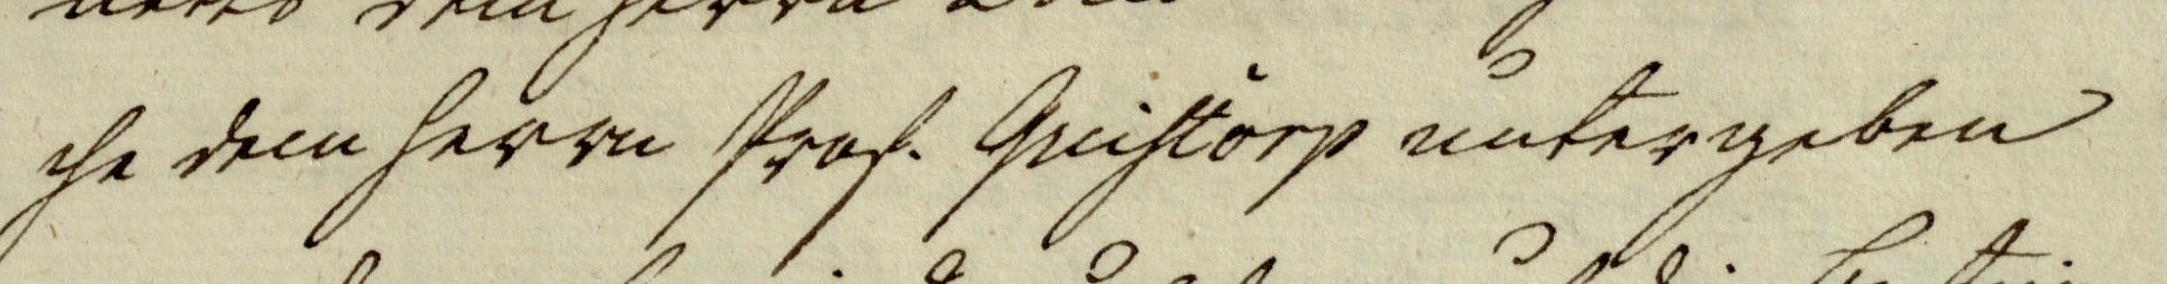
che dem Herrn Prof. Quistorp untergeben
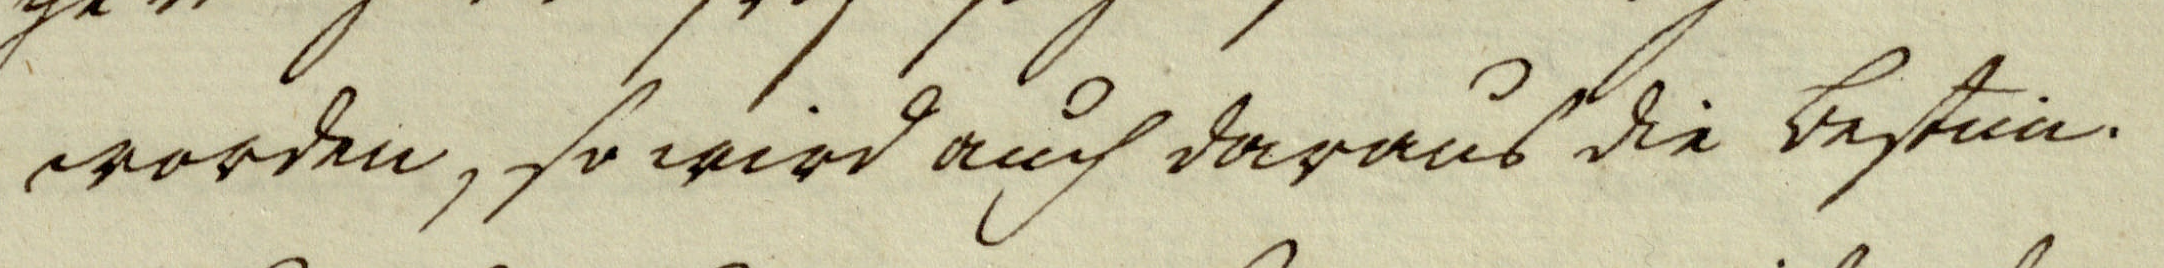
worden, so wird auch daraus die Bestim¬
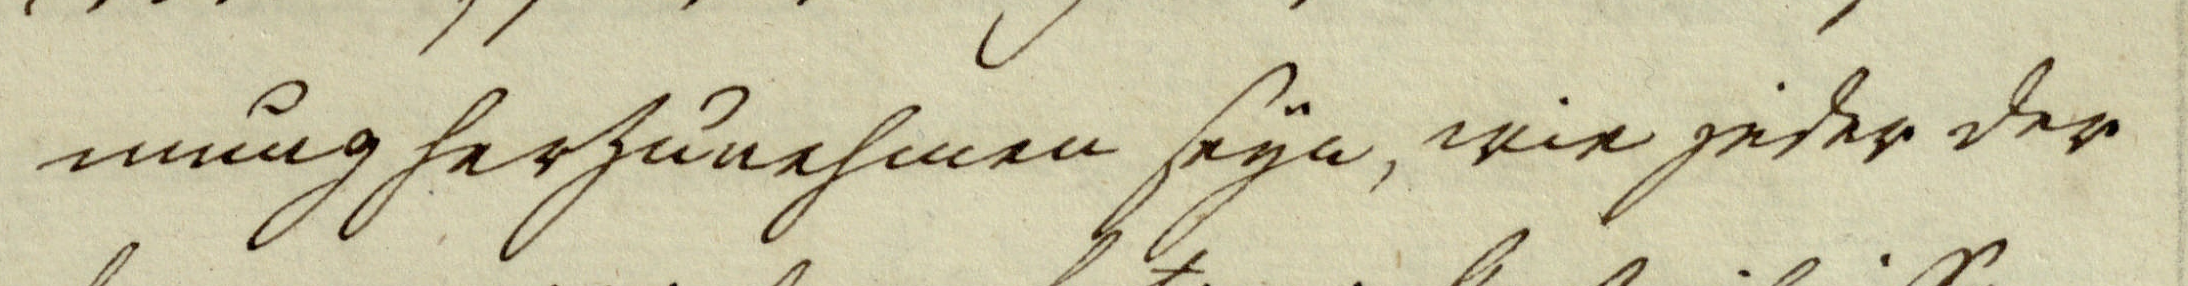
mung herzunehmen seÿn, wie jeder der
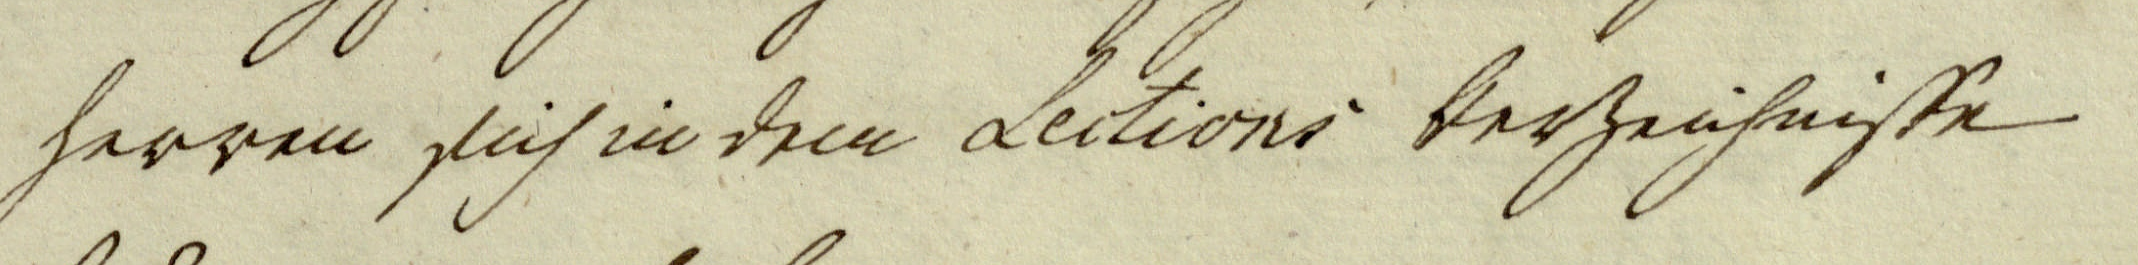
Herren sich in dem Lections Verzeichnisse
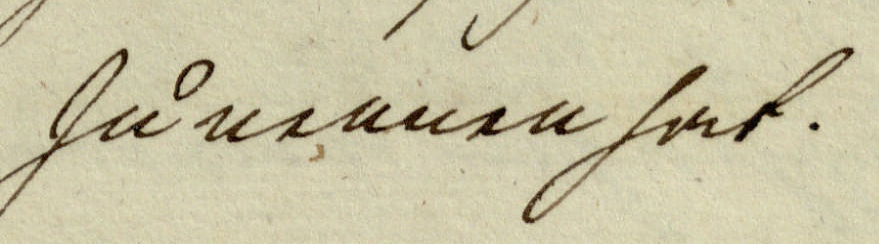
zu nennen hat
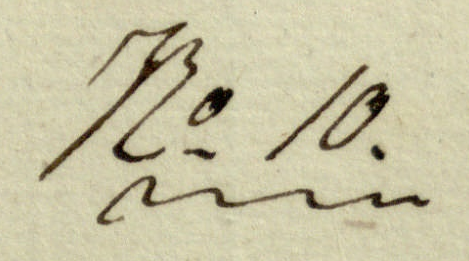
No 10.
